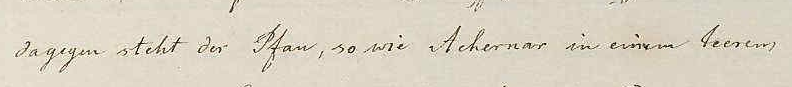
dagegen steht der Pfau, so wie Achernar in einem leeren,
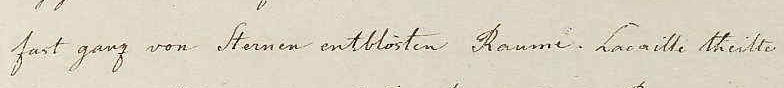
fast ganz von Sternen entblösten Raume. Lacaille theilte
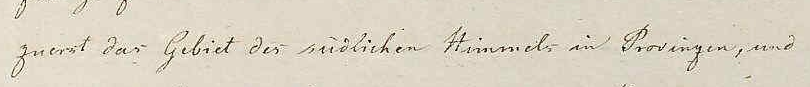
zuerst das Gebiet des südlichen Himmels in Provinzen, und
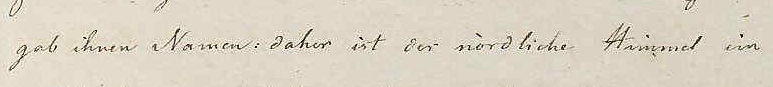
gab ihnen Namen: daher ist der nördliche Himmel ein
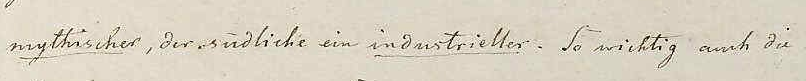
mythischer, der südliche ein industrieller. So wichtig auch die
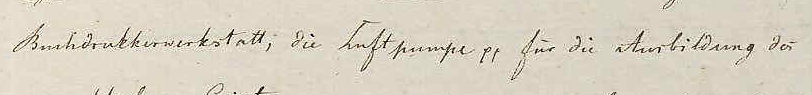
Buchdrukkerwerkstatt, die Luftpumpe pp für die Ausbildung des
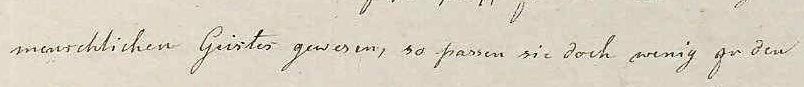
menschlichen Geistes gewesen, so passen sie doch wenig zu den
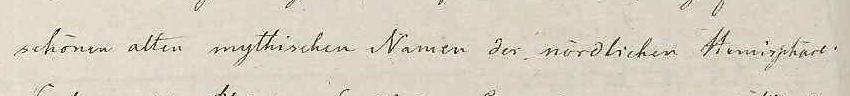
schönen alten mythischen Namen der nördlichen Hemisphäre.
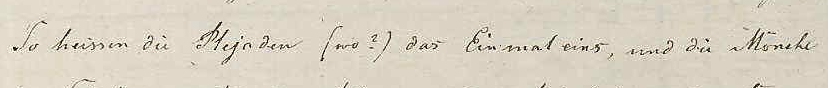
So heissen die Plejaden das Einmaleins, und die Mönche
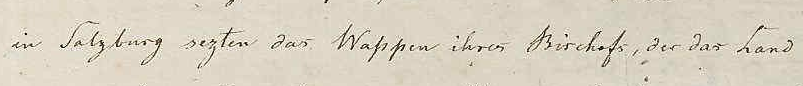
in Salzburg sezten das Wappen ihres Bischofs, der das Land
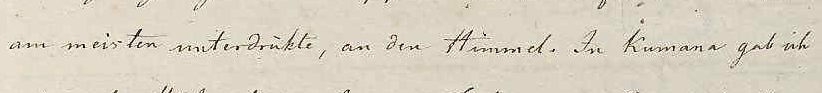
am meisten unterdrükte, an den Himmel. In Kumana gab ich
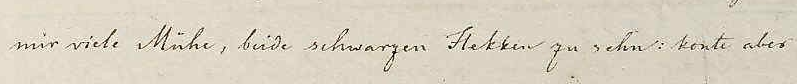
mir viele Mühe, beide schwarzen Flekken zu sehn: konte aber
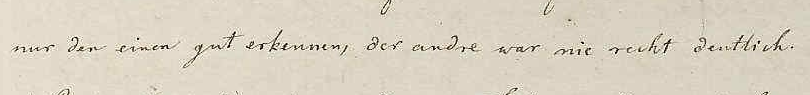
nur den einen gut erkennen, der andre war nie recht deutlich.
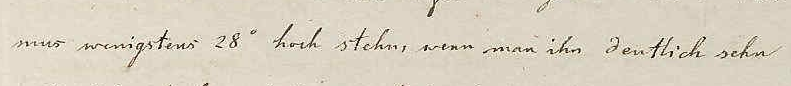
mus wenigstens 28° hoch stehn, wenn man ihn deutlich sehn
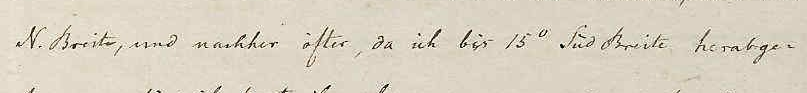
N.Breite, und nachher öfter, da ich bis 15° SüdBreite herabge-
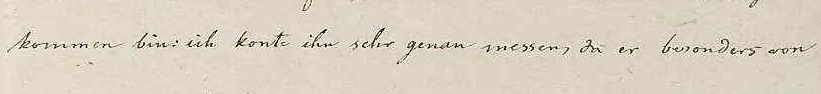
kommen bin: ich konte ihn sehr genau messen, da er besonders von
